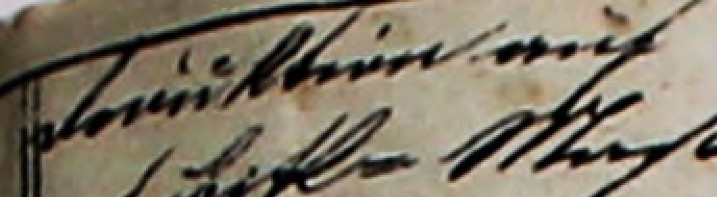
Reduktion auf
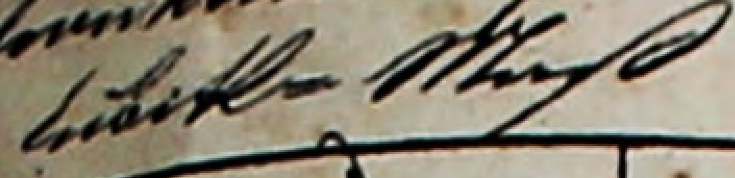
Cubik= Maß
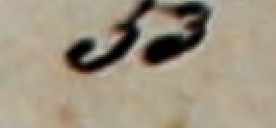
53
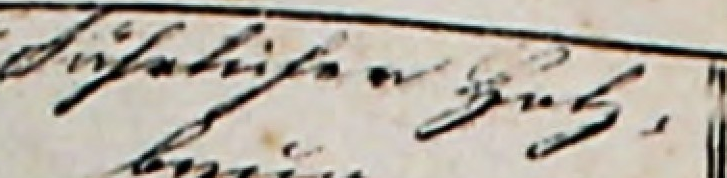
Jährlicher Holz„
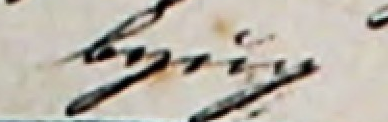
bezug
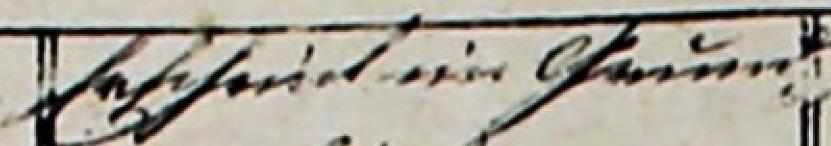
Erscheint im Grund„
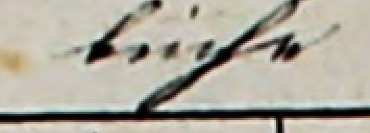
buche
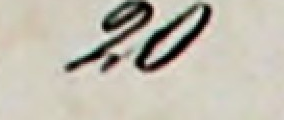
20
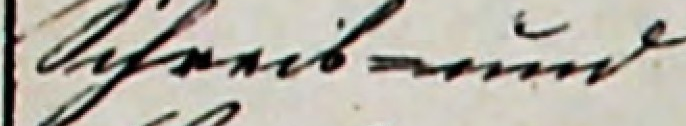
Schreib = und
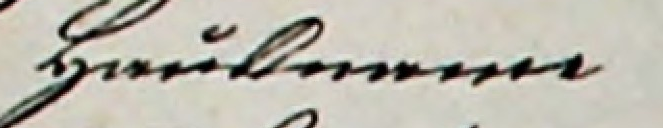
Hausmann
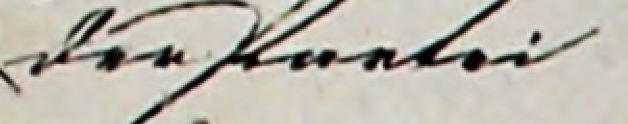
der Partei
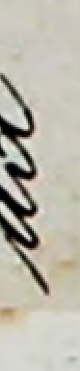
ad
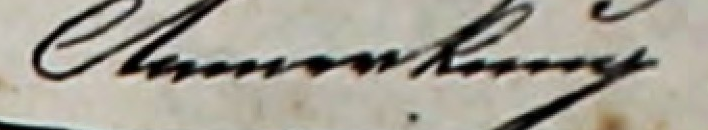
Anmerkung
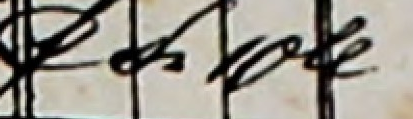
???
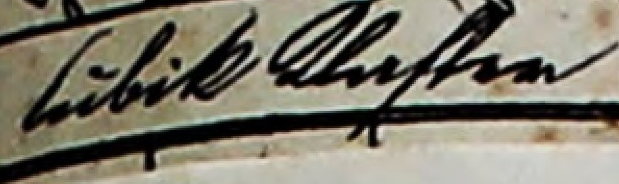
Cubik Klafter
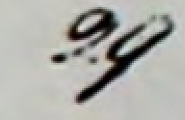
29
